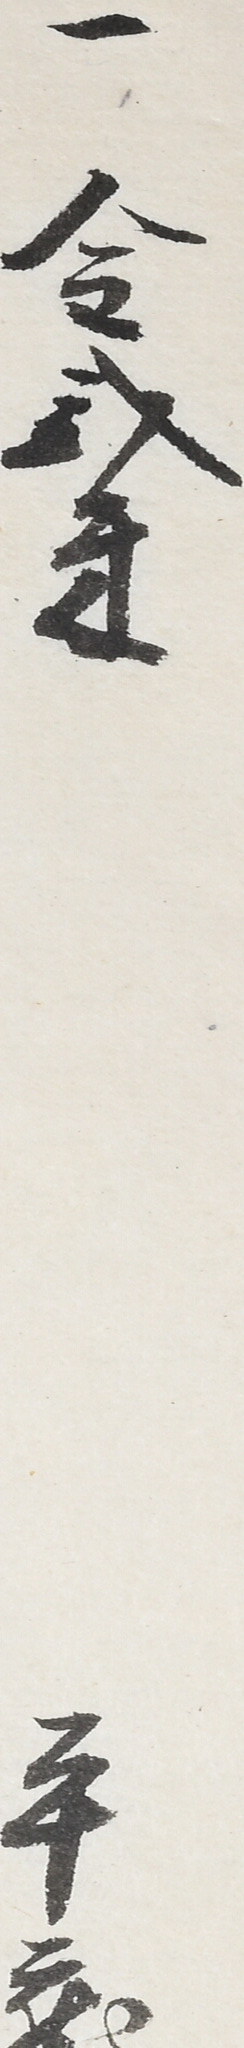一金弐朱平蔵
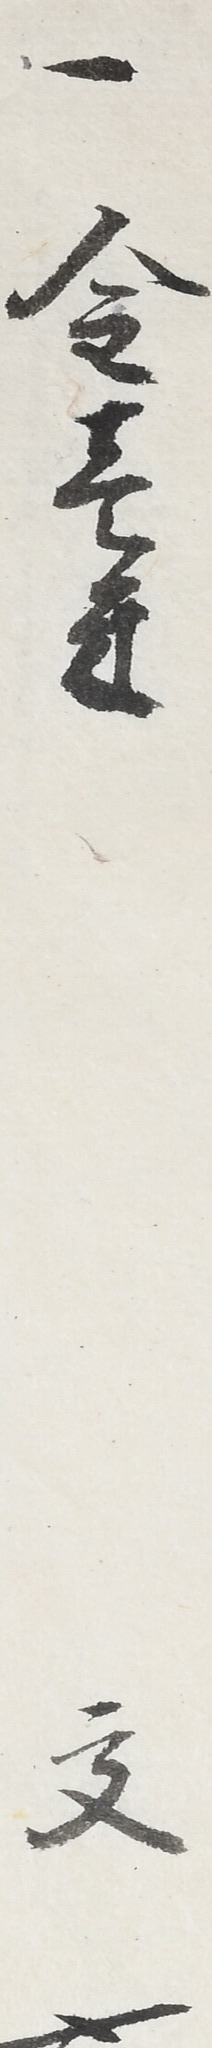一金壱朱文六
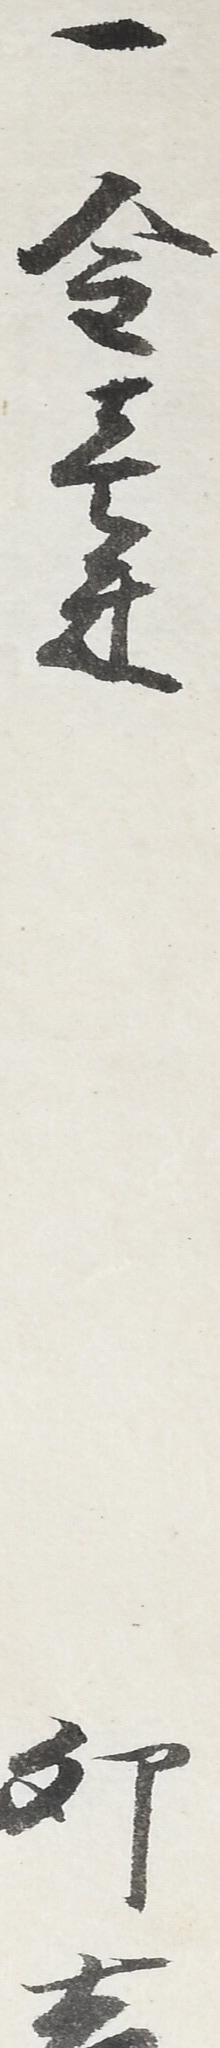一金壱朱忠右衛門

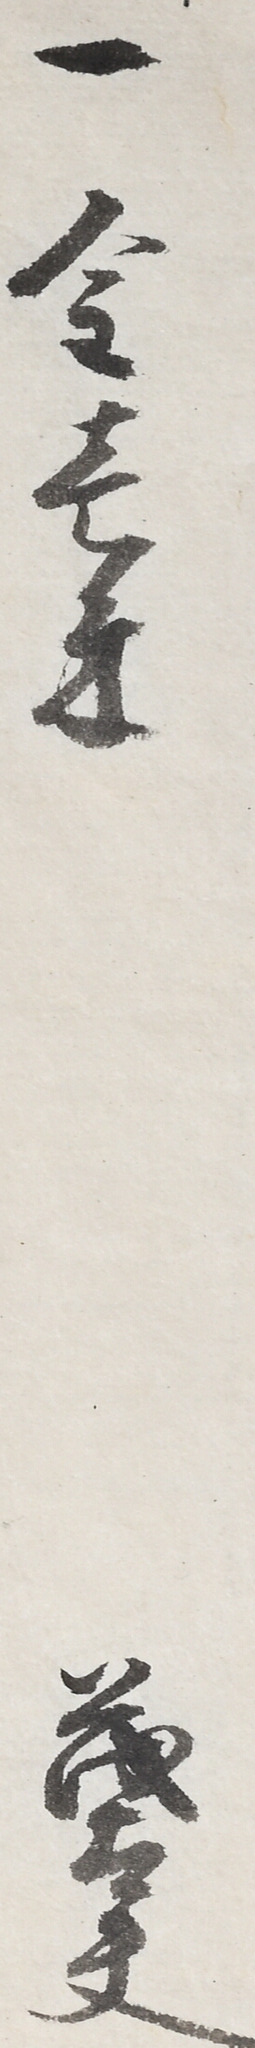一金壱朱茂太夫
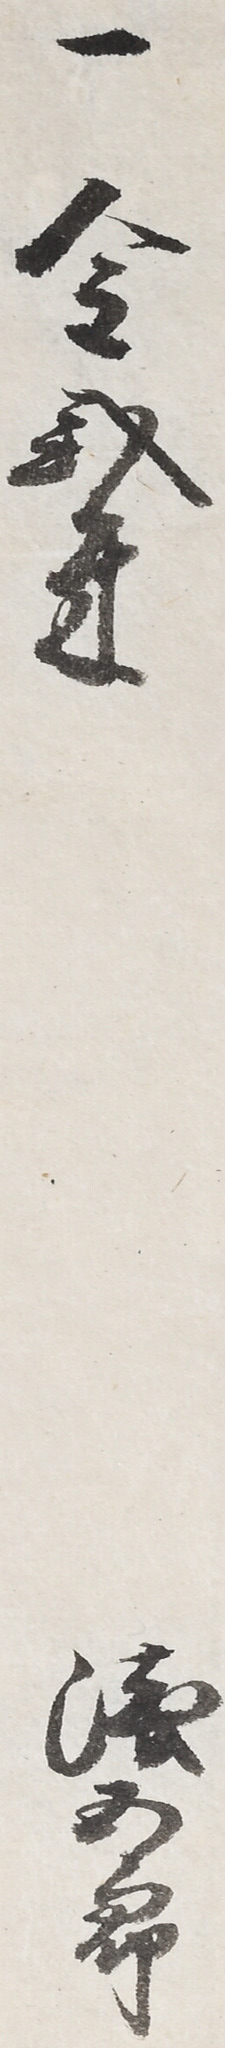一金弐朱浅五郎
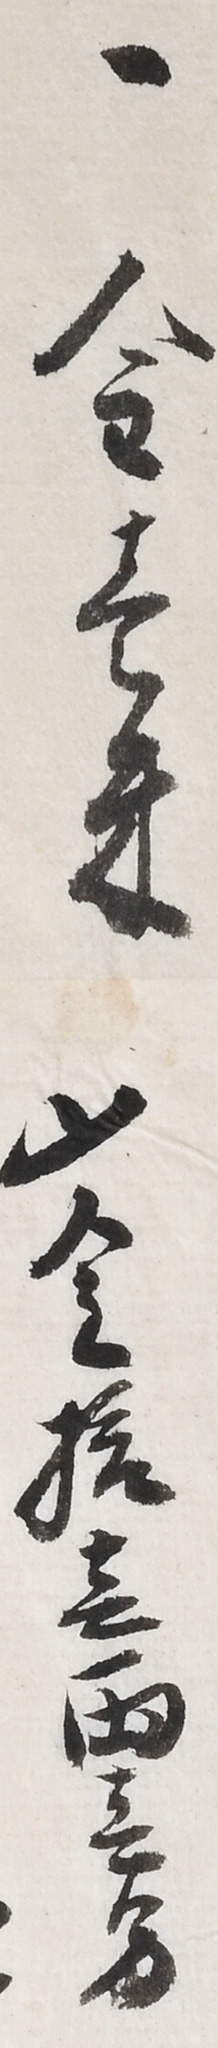一金壱朱「〆金拾壱両壱分
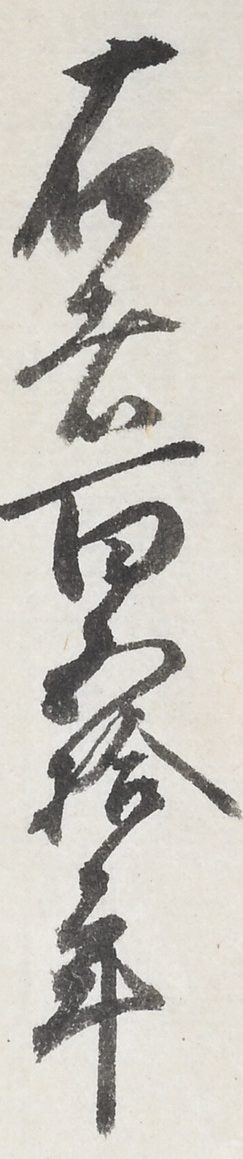右は百五拾年
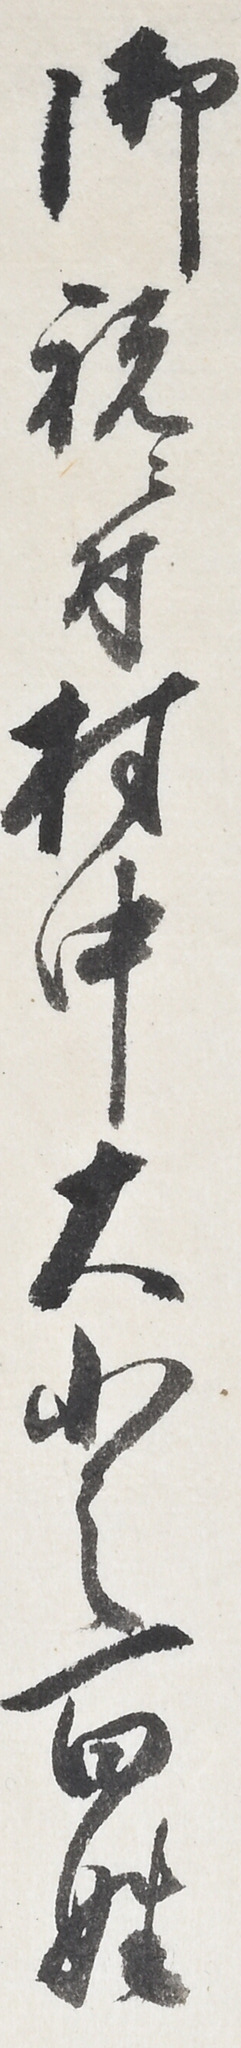御祝ニ付村中大小之百姓
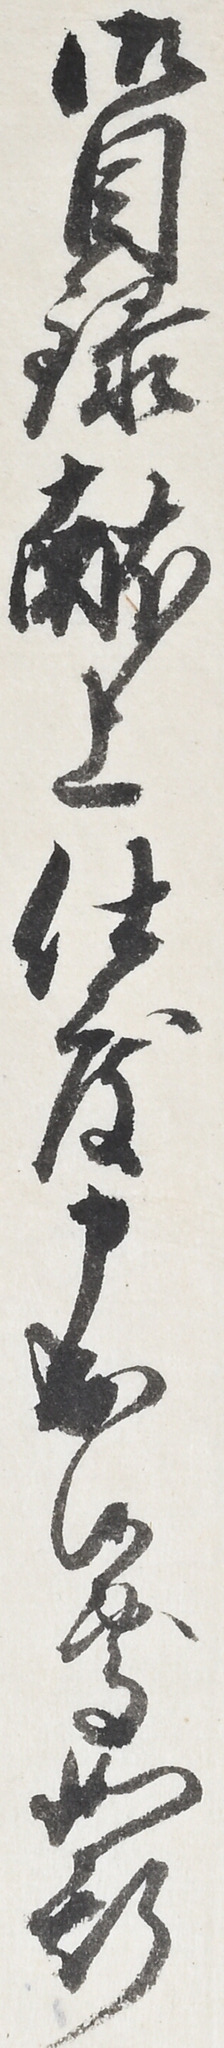御目録献上仕度申出候処如斯
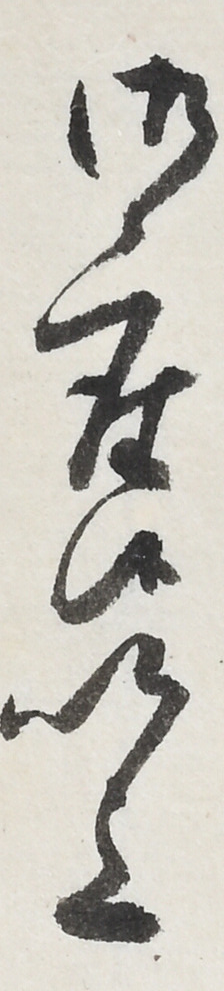御座候以上
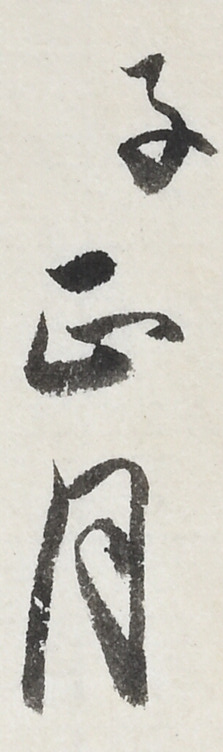子正月

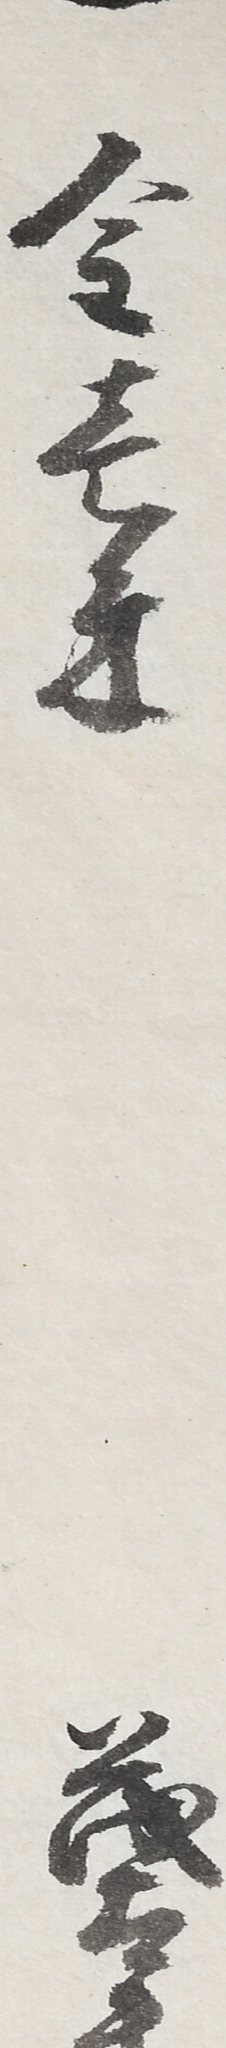一金壱朱茂太夫
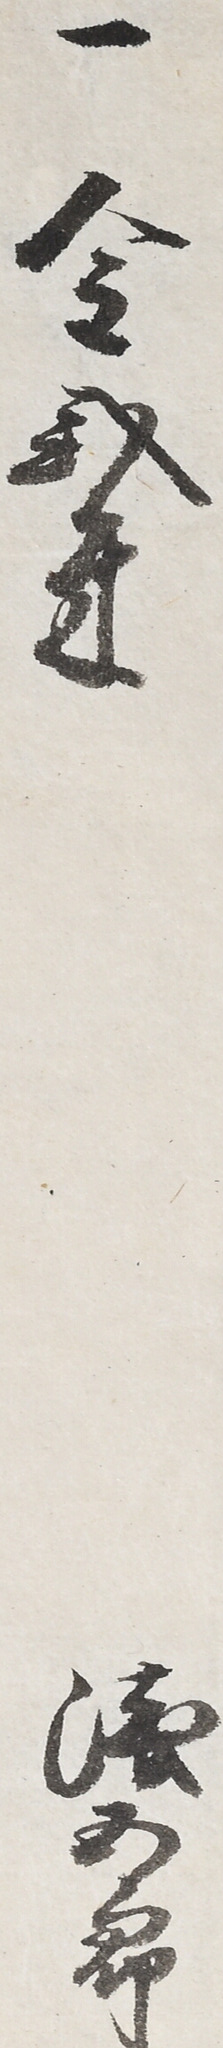一金弐朱浅五郎
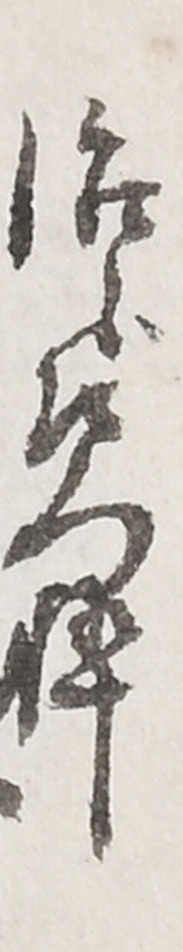治郎左衛門忰
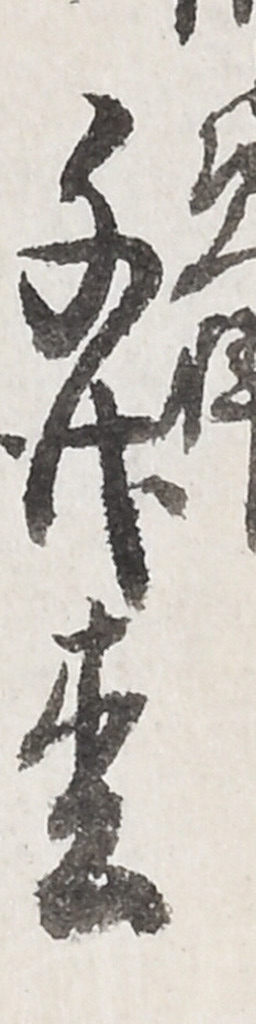千代松
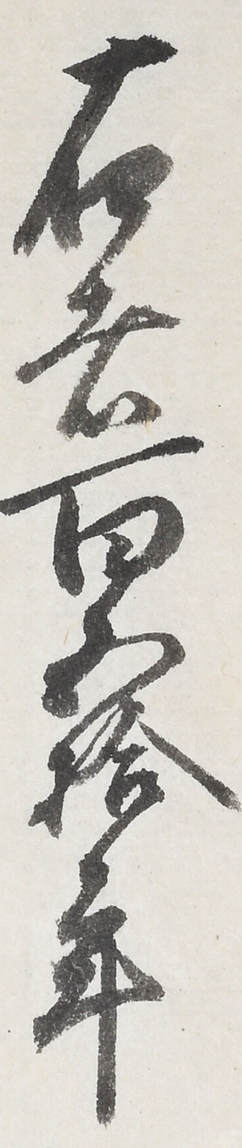右は百五拾年
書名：御拝地百五拾年御祝儀献上御目録名前
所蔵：伊那市立高遠町図書館・合同会社AMANE
